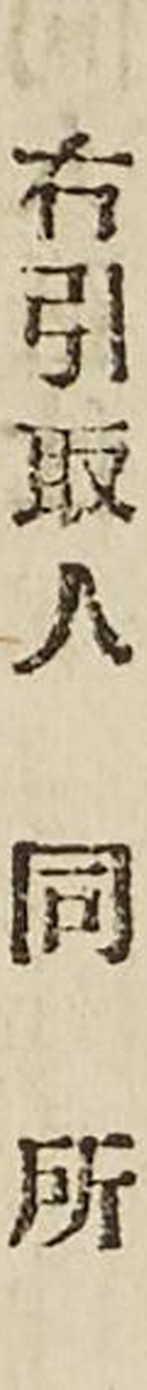右引取人同同
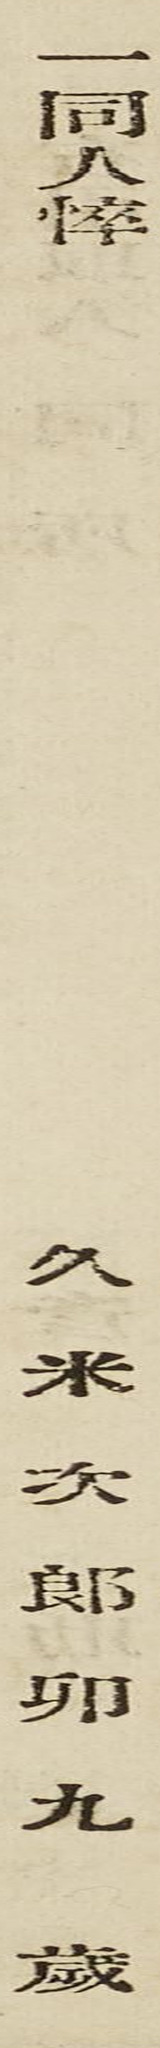一同人倅久米次郎卯九歳
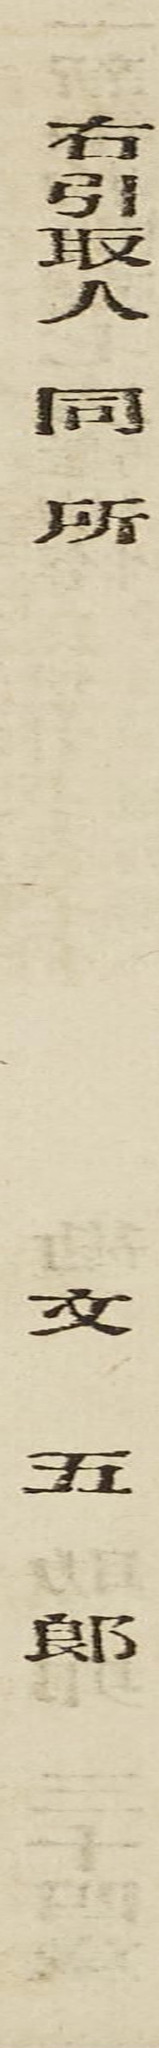右引取人同所文五郎
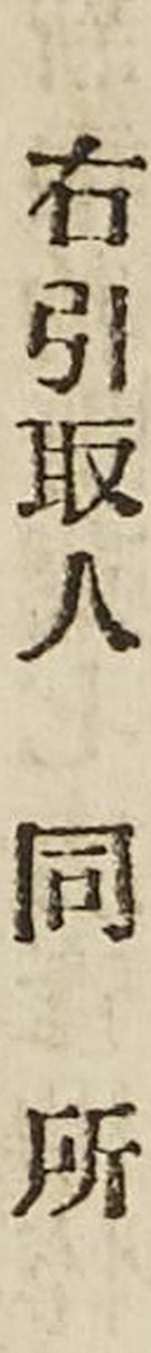右引取人同同
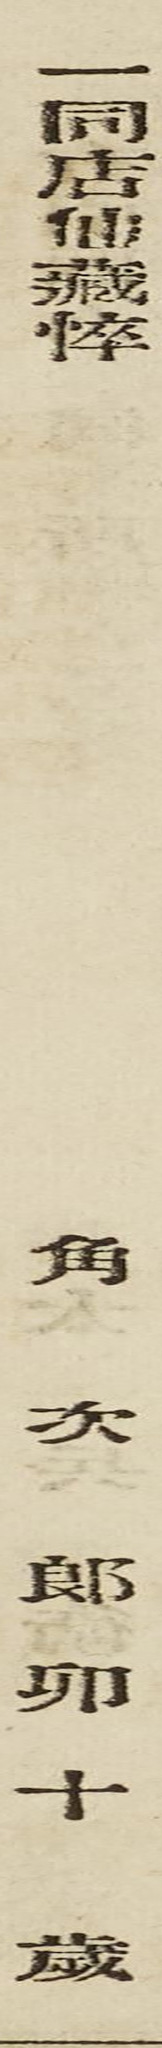一同店仙蔵倅角次郎卯十歳
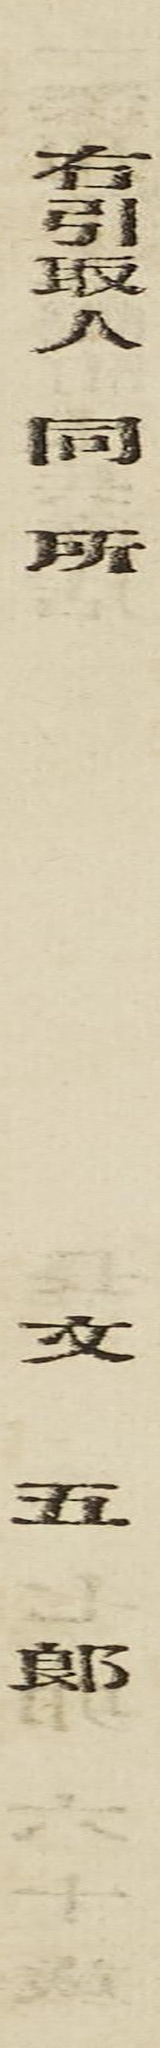右引取人同所文五郎
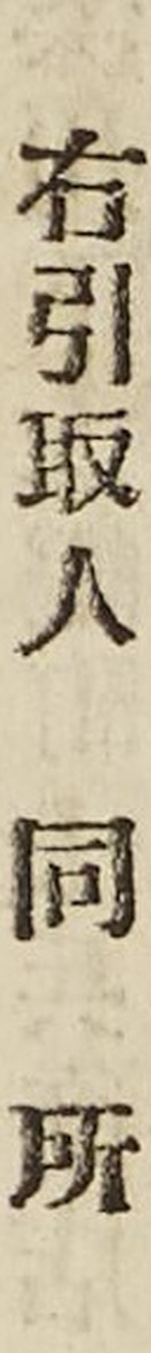右引取人同同
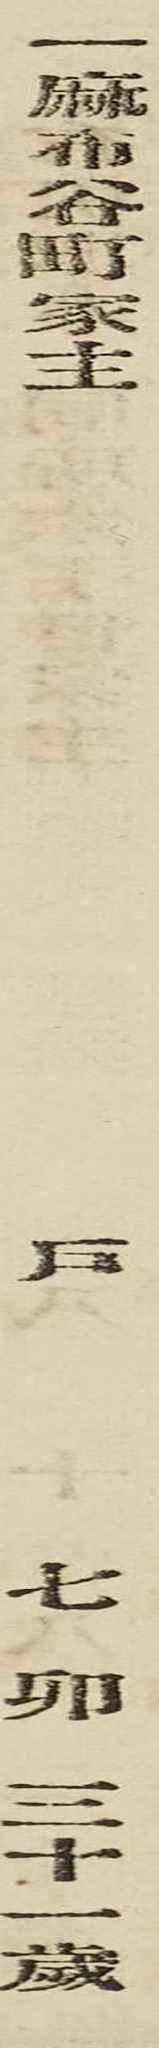一麻布谷町家主戸七卯三十一歳
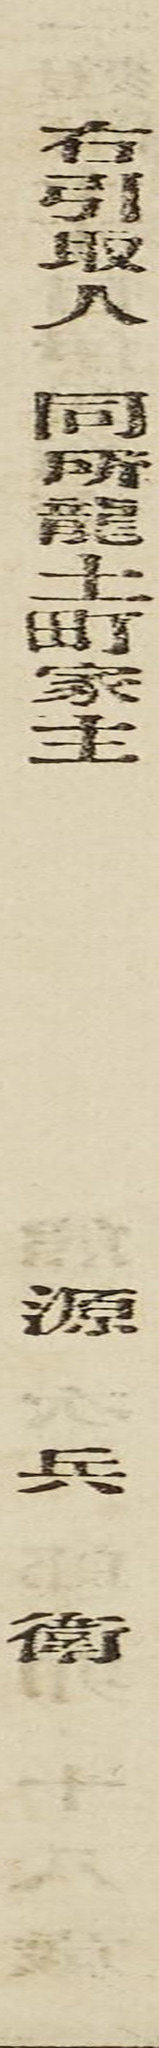右引取人同所龍土町家主源兵衛
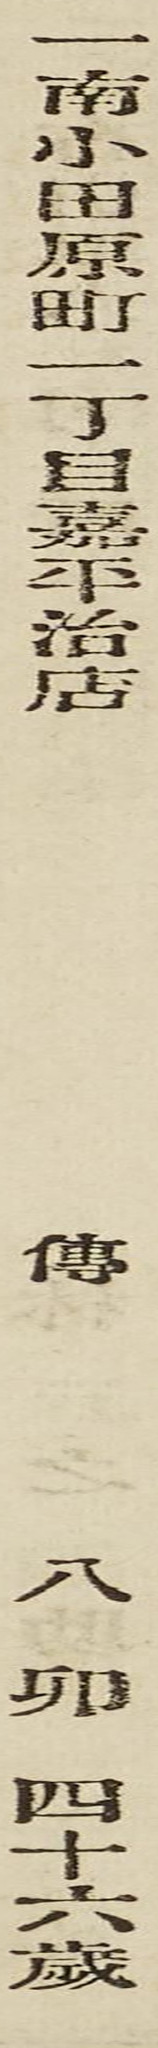一南小田原町一丁目嘉平治店傳八卯四十六歳
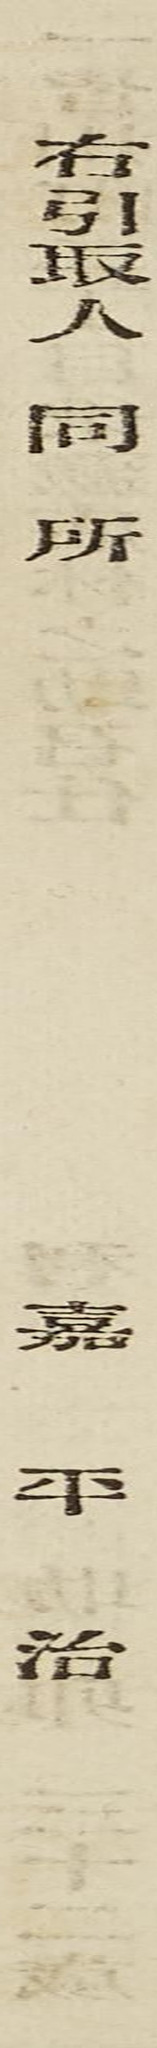右引取人同所嘉平治
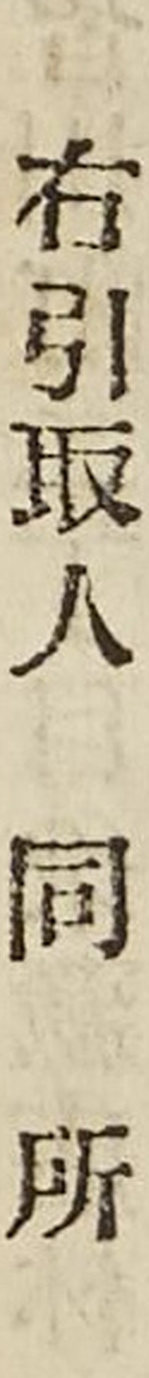右引取人同同
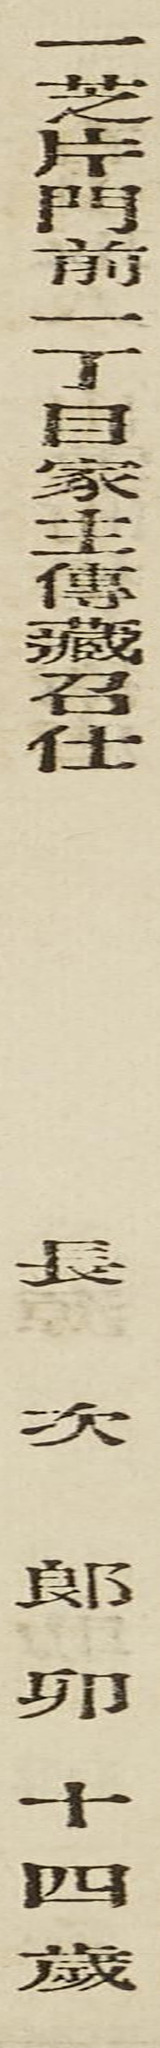一芝片門前一丁目家主傳蔵召仕長次郎卯十四歳
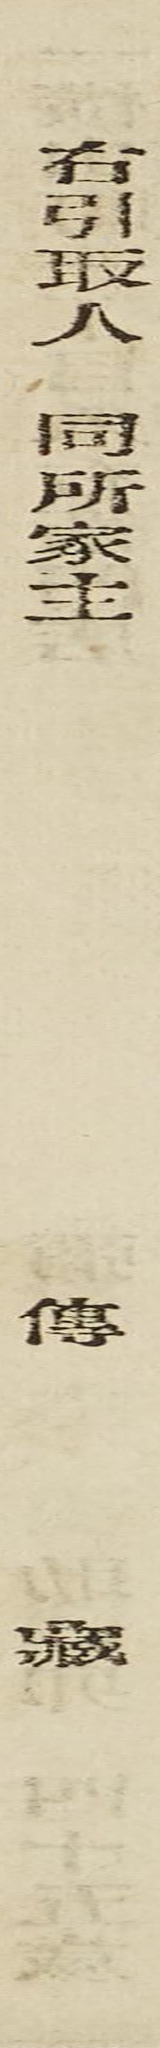右引取人同所家主傳蔵
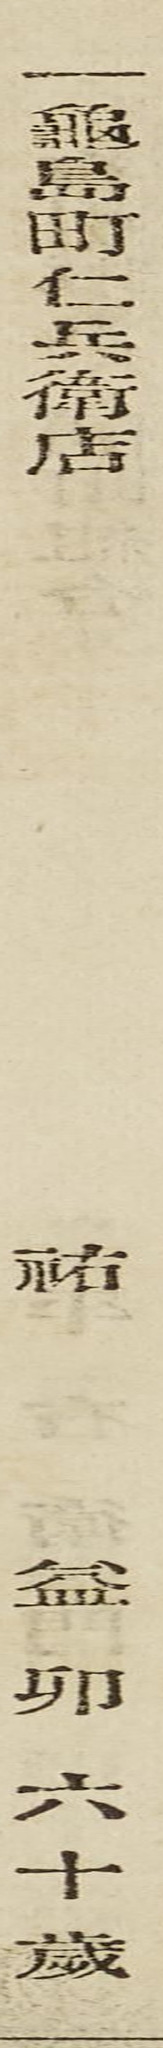一亀島町仁兵衛店祐益卯六十歳
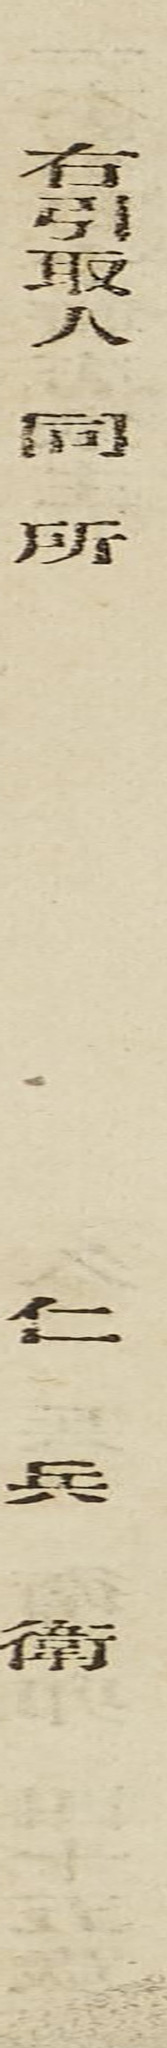右引取人同所仁兵衛
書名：永代惨話　文化の夢　全
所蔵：東京大学地震研究所図書室 Earthquake Research Institute Library, The University of Tokyo, JAPAN
